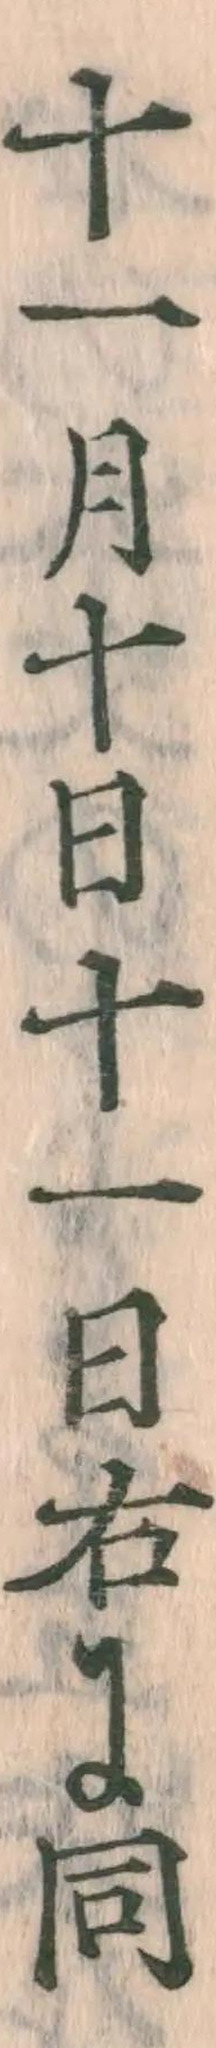十一月十日十一日右に同
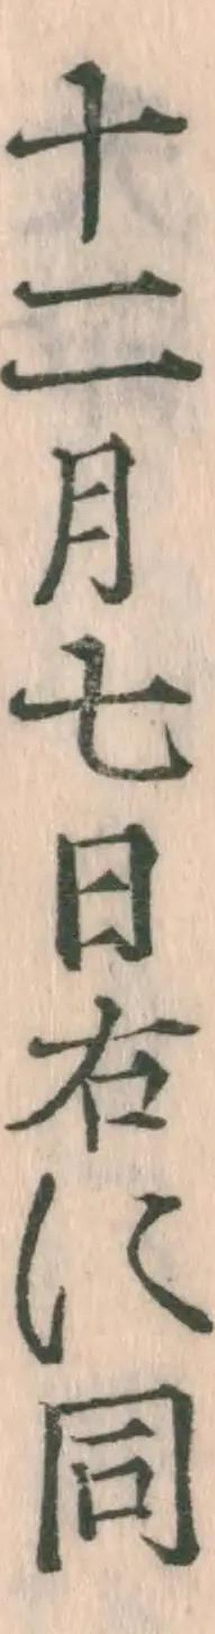十二月七日右に同
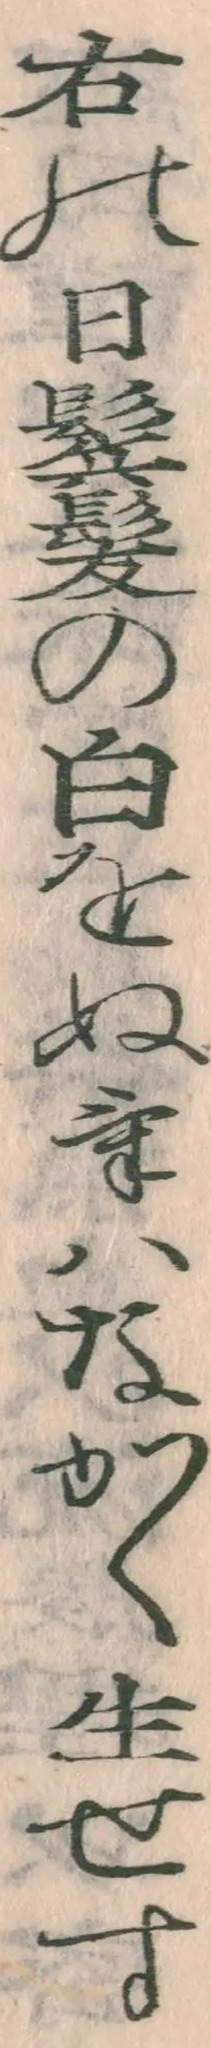右の日鬢髪の白をぬけはなかく生せす
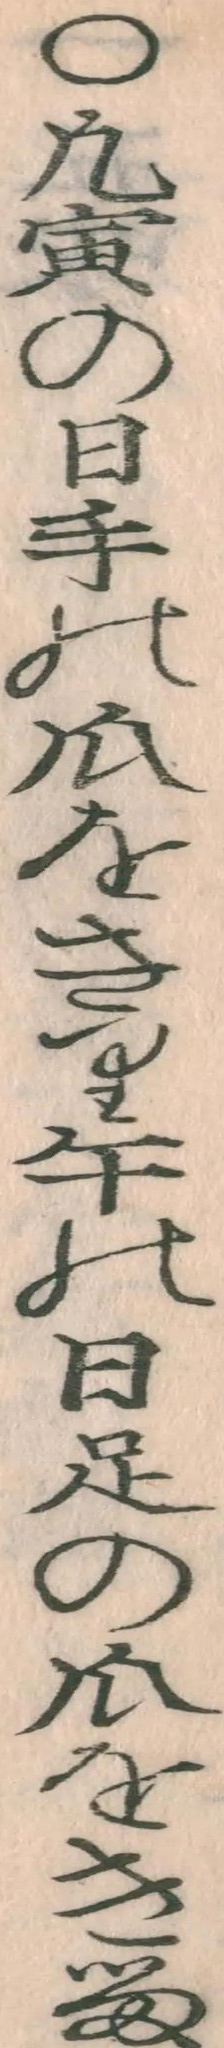〇凡寅の日手の爪をきり午の日足の爪をきる
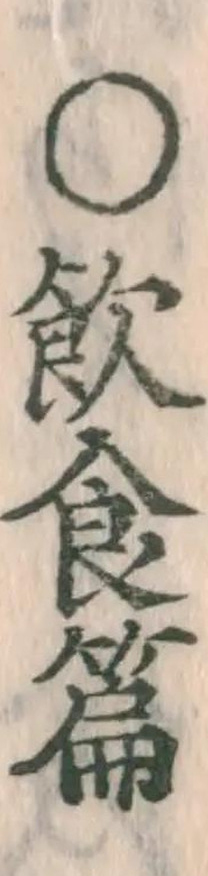〇飲食篇
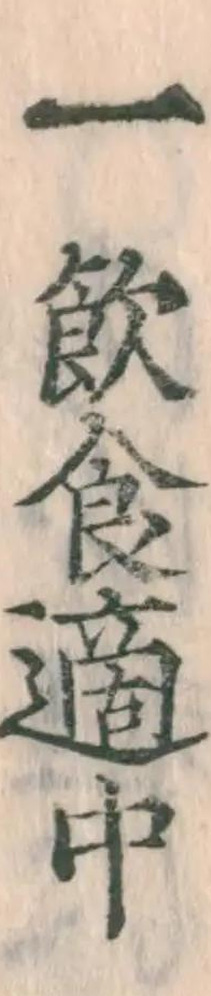一飲食適中
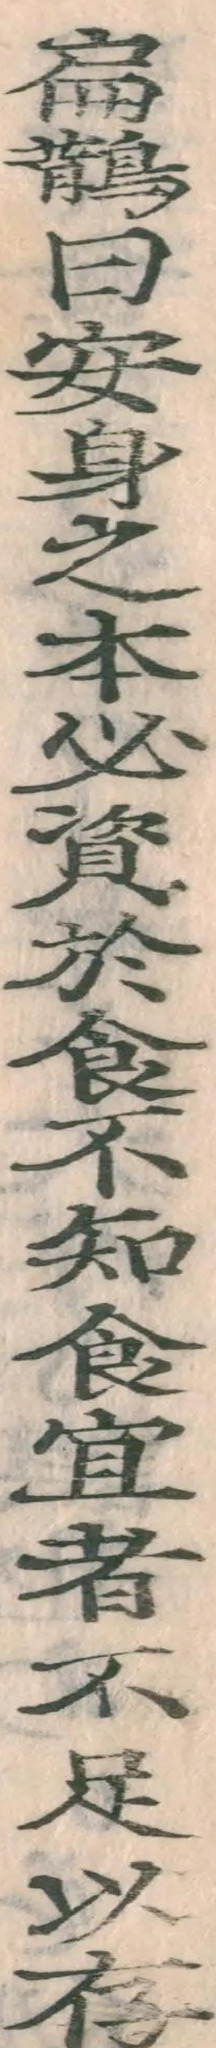扁鵲曰安身之本必資於食不知食宜者不足以存

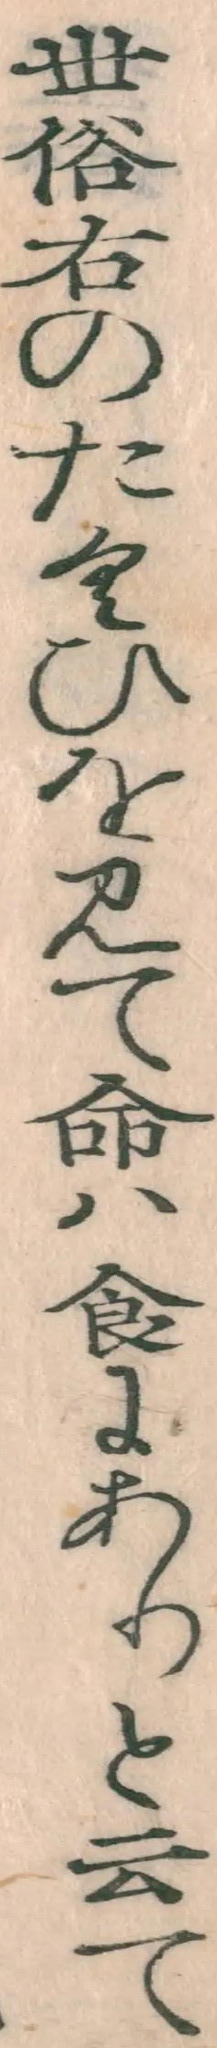世俗右のたくひを見て命は食にありと云て
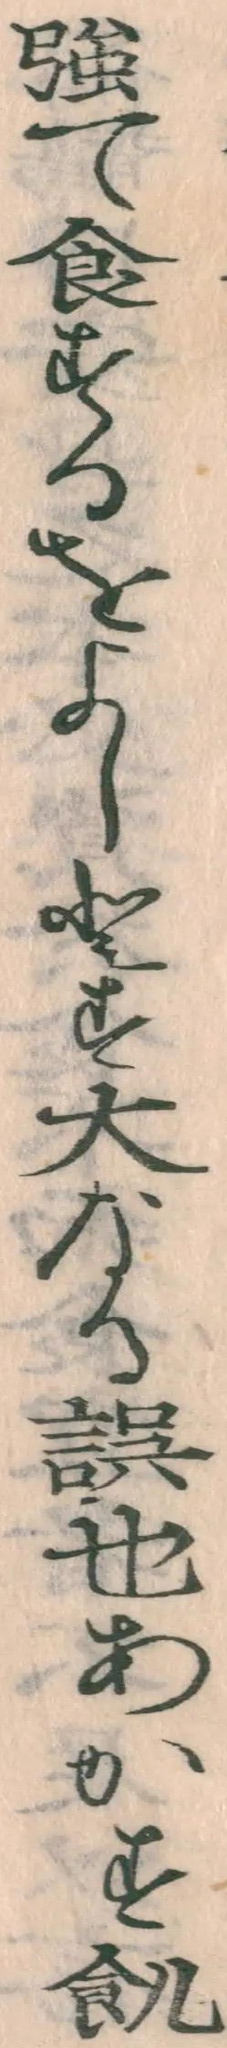強て食するをよしとす大なる誤也あかす飢
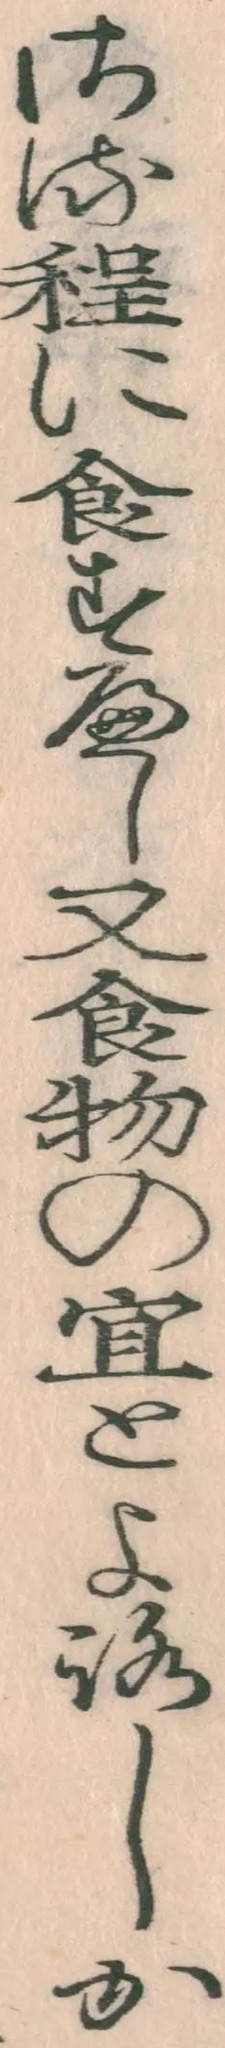さる程に食すへし又食物の宜とよろしか
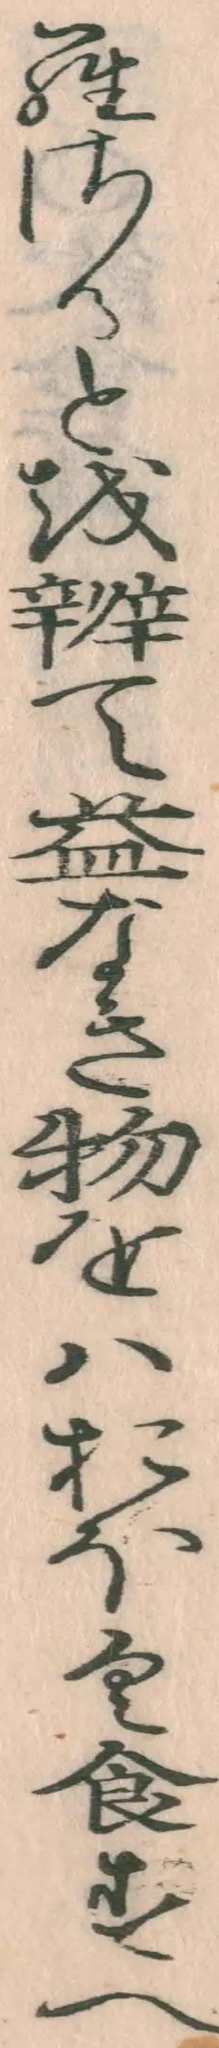らさるとを弁て益なき物をはおほく食すへ
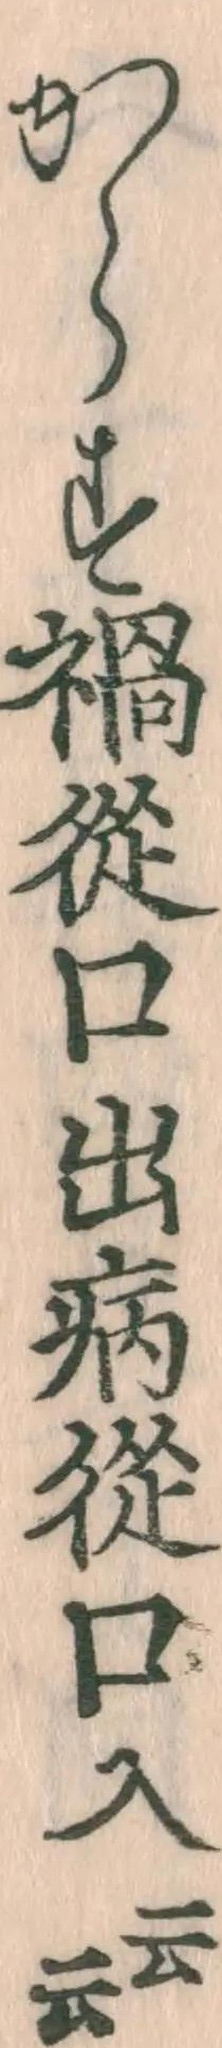からす禍従口出病従口入云云
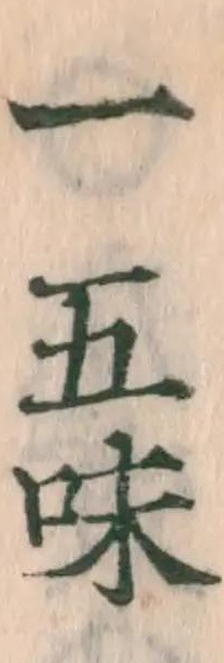一五味
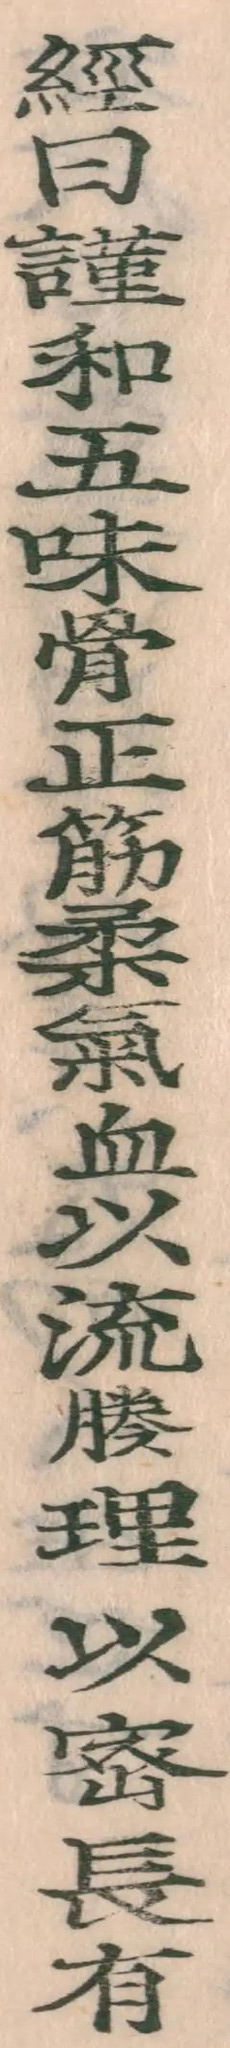経曰謹和五味骨正筋柔気血以流腠理以密長有
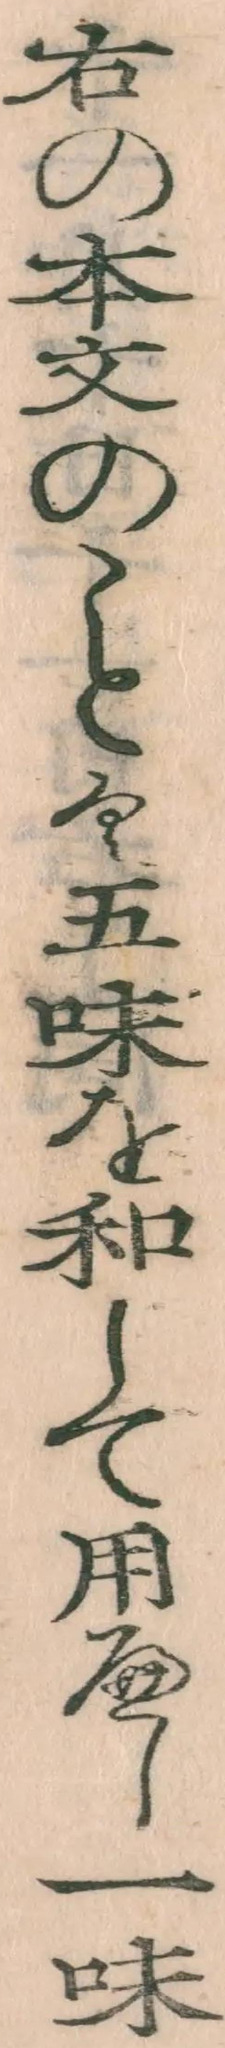右の本文のことく五味を和して用へし一味
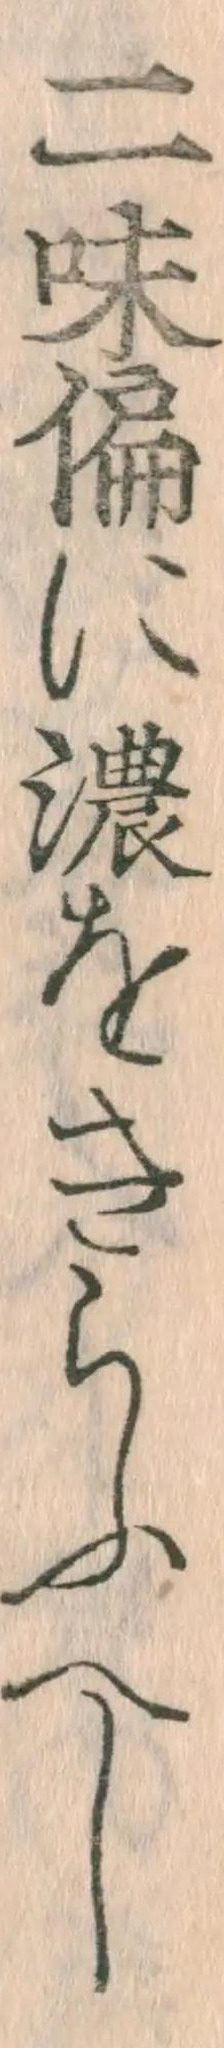二味偏に濃をきらふへし
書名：延壽撮要
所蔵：国立国会図書館 National Diet Library, JAPAN
